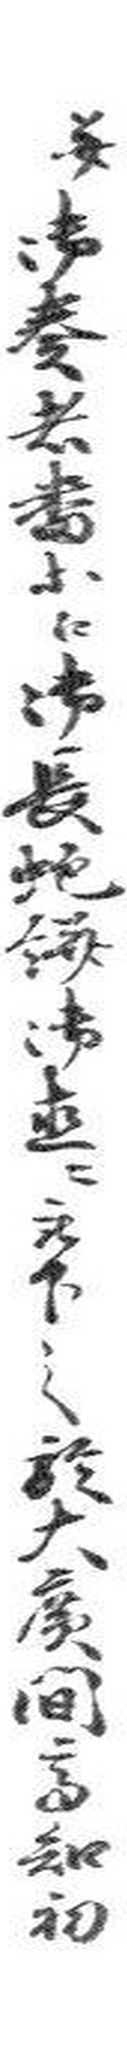并御奏者番等江御長蚫餅御直ニ被下之於大広間高知初
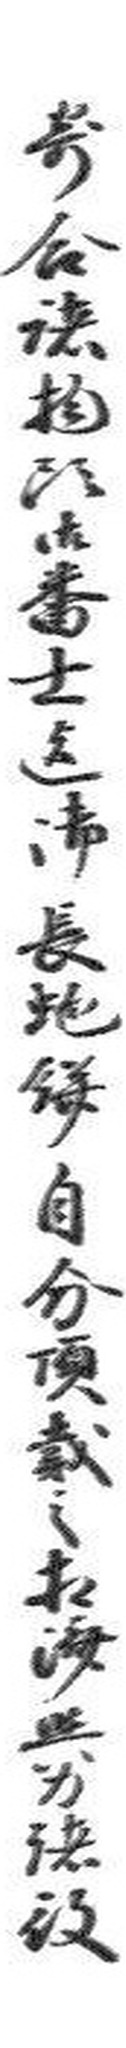寄合諸物頭御番士迄御長蚫餅自分頂戴之相済与力諸役
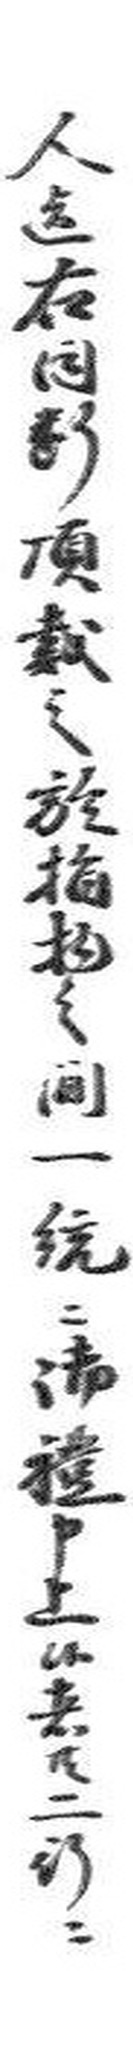人迄右同断頂戴之於指物之間一統ニ御礼申上候者共二行ニ
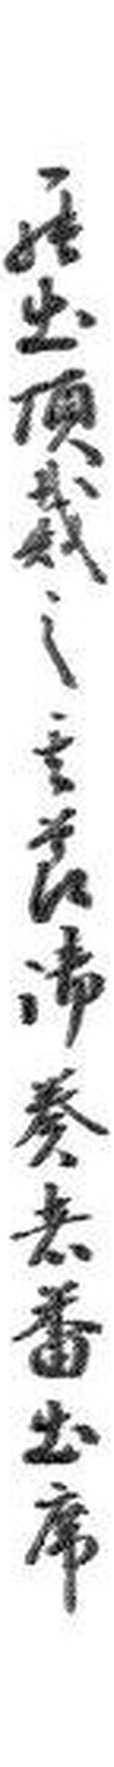罷出頂戴之其節御奏者番出席
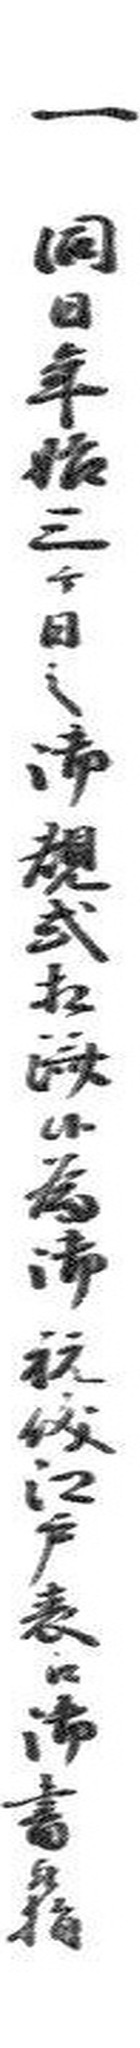一同日年始三ヶ日之御規式相済候為御祝儀江戸表江御書被指
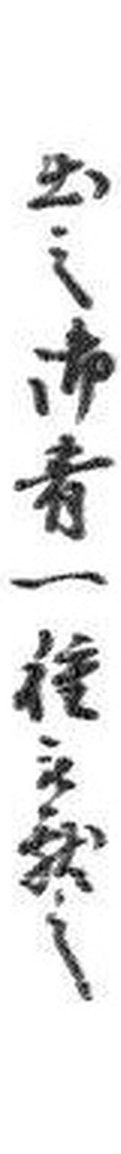出之御肴一種被献之
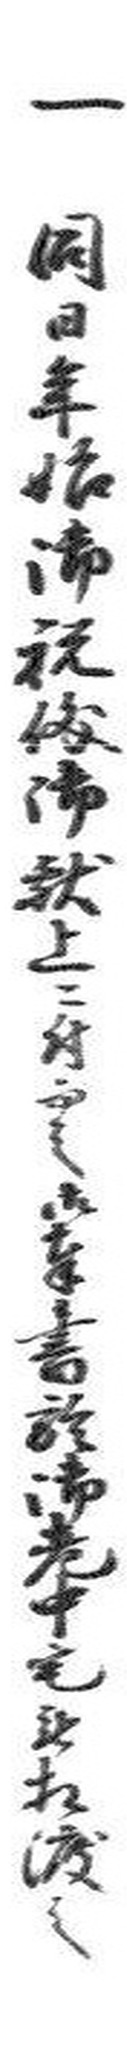一同日年始御祝儀御献上ニ付而之御奉書於御老中宅被相渡之
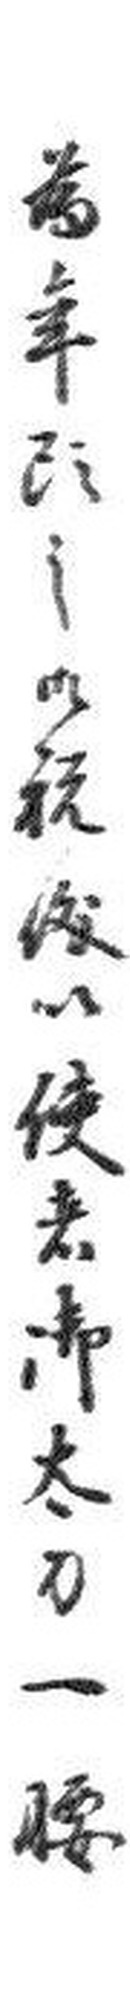為年頭之御祝儀以使者御太刀一腰
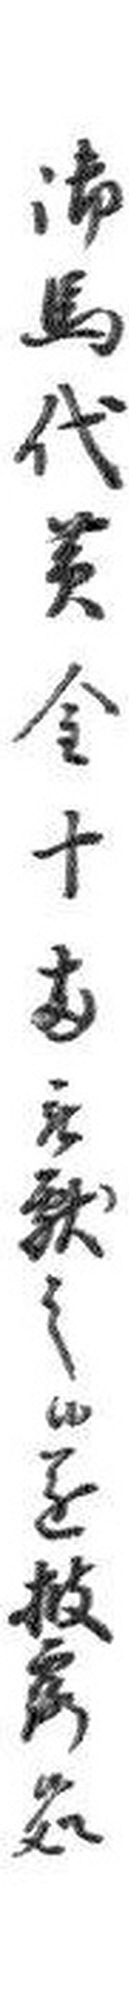御馬代黄金十両被献之候遂披露候処
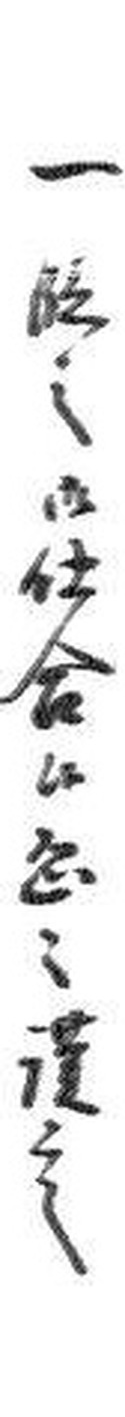一段之御仕合候恐々謹言

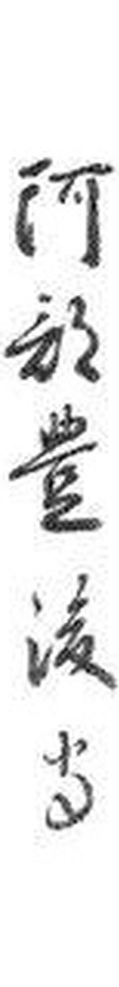阿部豊後守
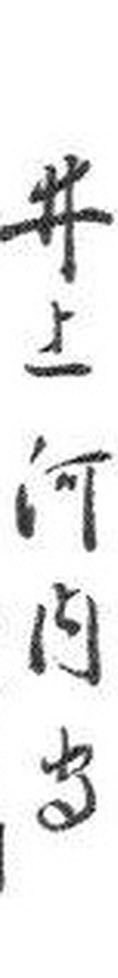井上河内守
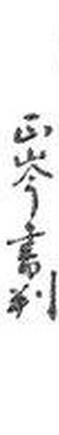正岑書判
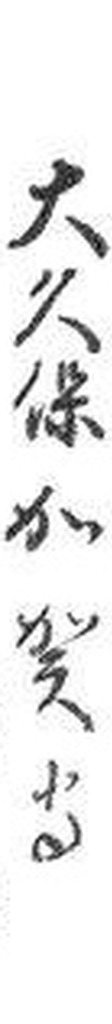大久保加賀守
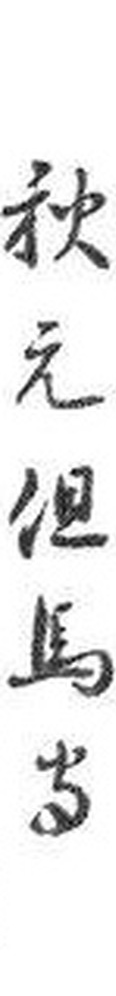秋元但馬守
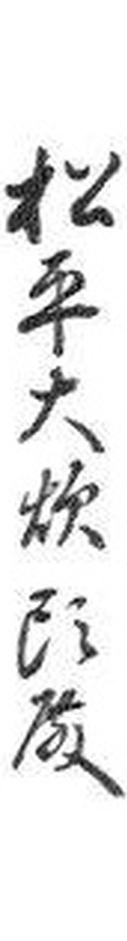松平大炊頭殿
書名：家譜 二十九 吉邦公 従正徳二年到正徳三年
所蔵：福井県文書館 Fukui Prefectural Archives
